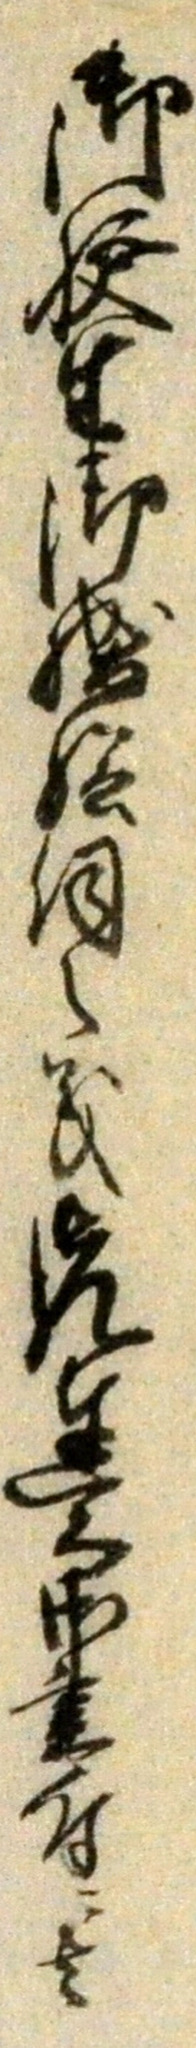御誕生御機嫌伺之義先達而御書付ニは
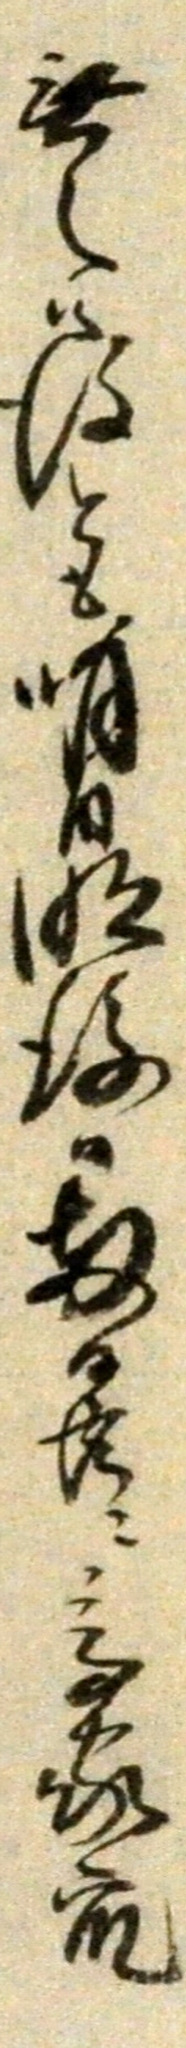無之候得とも明日明後日両日共ニ高家衆
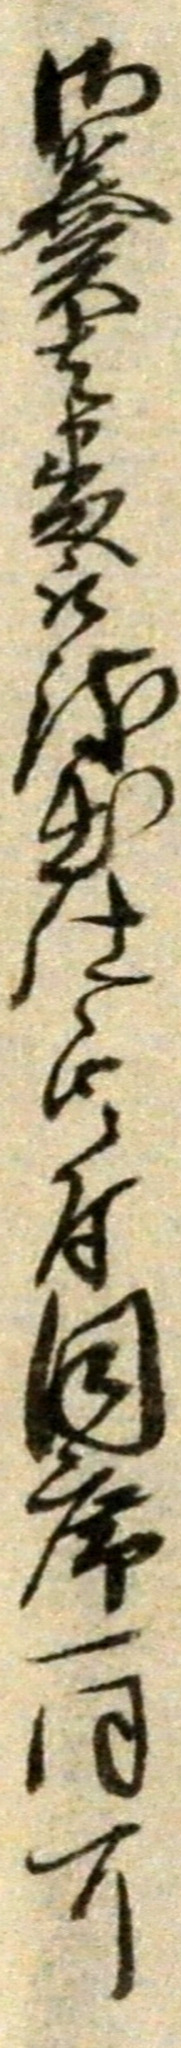御奏者番被致出仕候由ニ付同席一同可
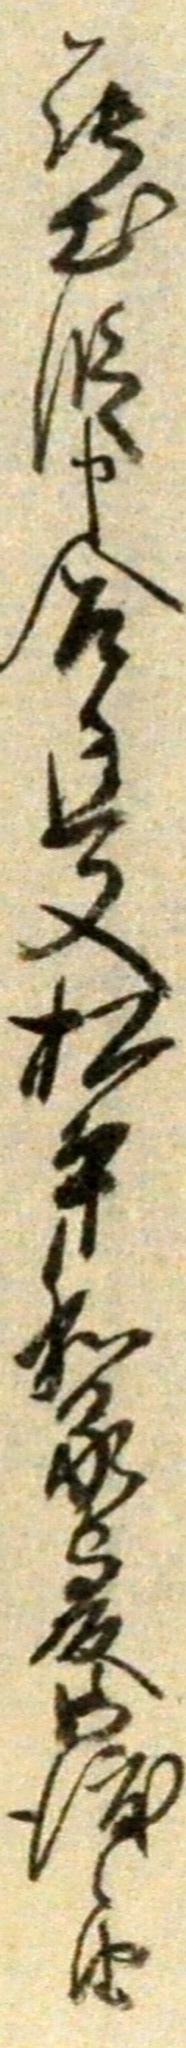罷出段申合候且又松平和泉守殿御渡之由
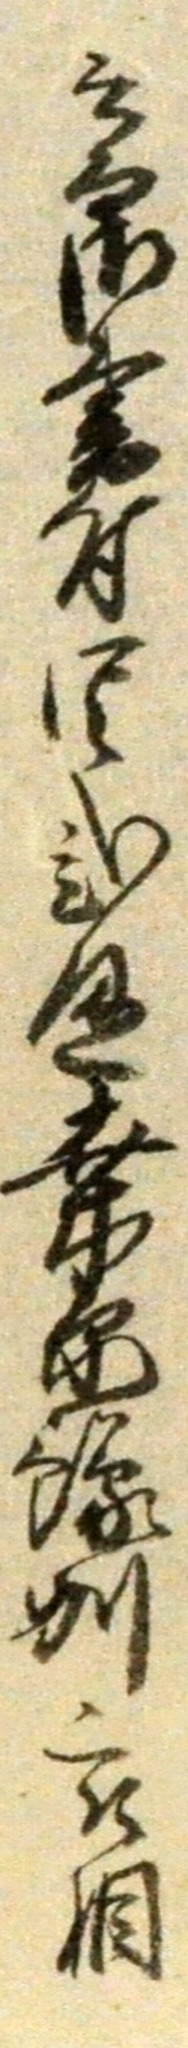ニ而御書付写弐通桑原豫州ニ被相
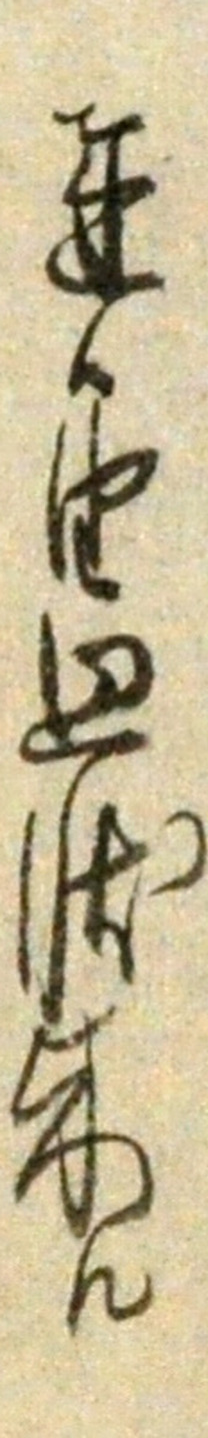達候由廻状来ル

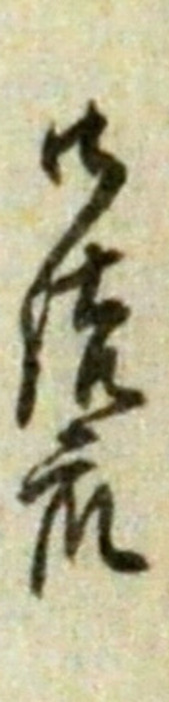御詰衆
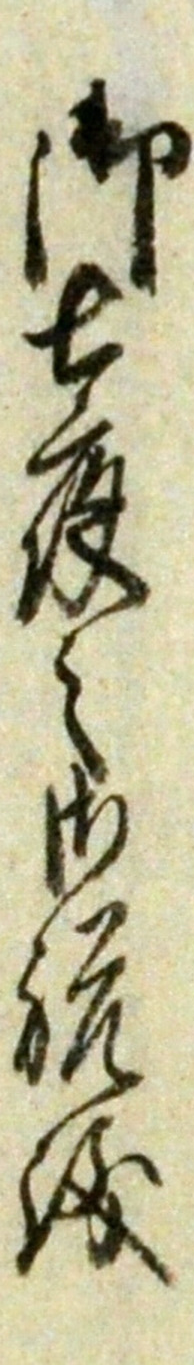御七夜之御祝儀
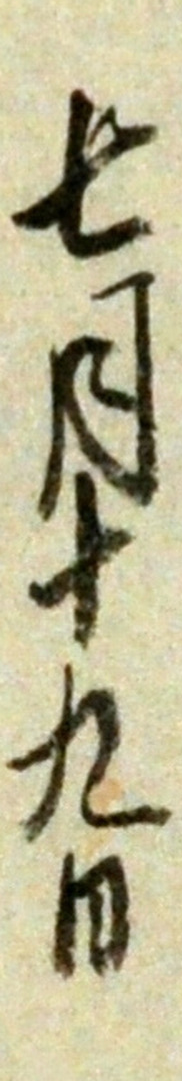七月十九日
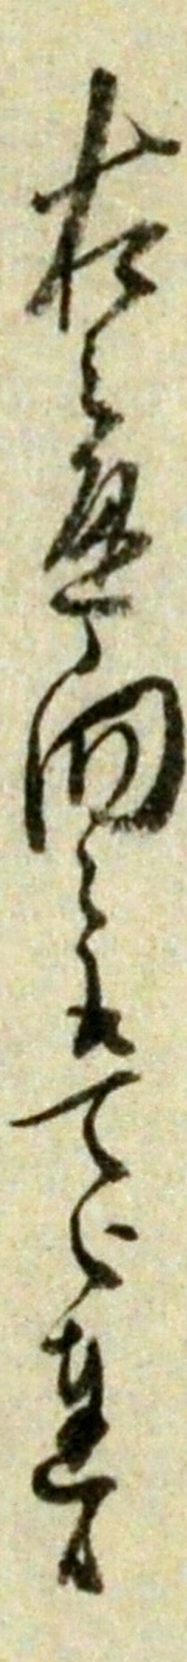右之通向々え可被達候
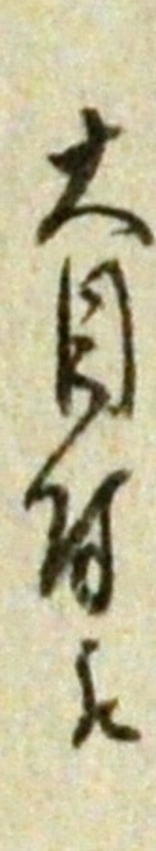大目付え
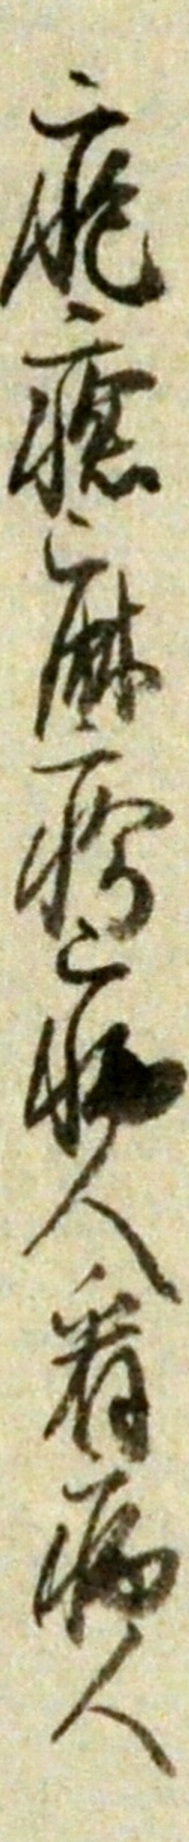疱瘡麻疹病人看病人
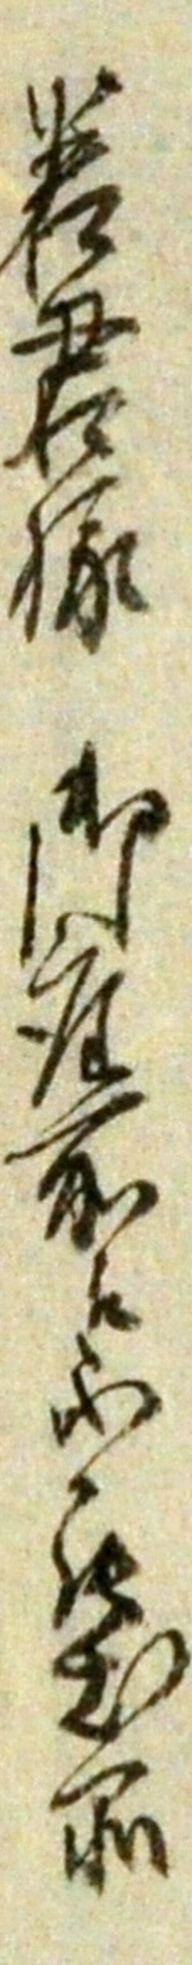若君様御座所え不罷出所
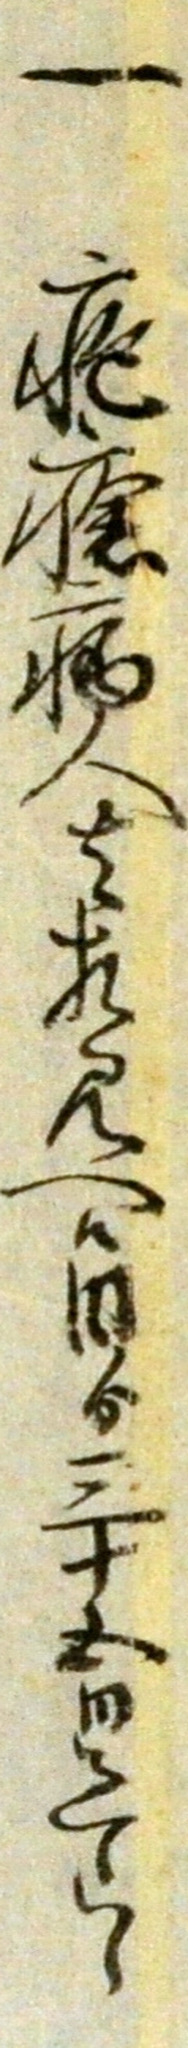一疱瘡病人を相見へ候日ゟ三十五日過候ハゝ
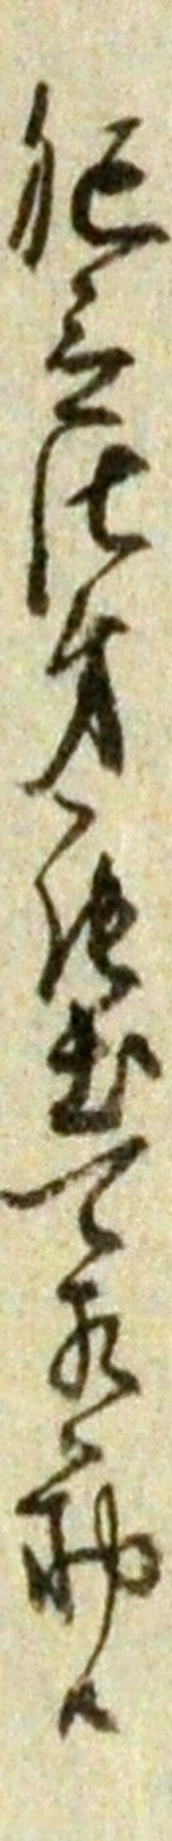肥立次第罷出可相勤候
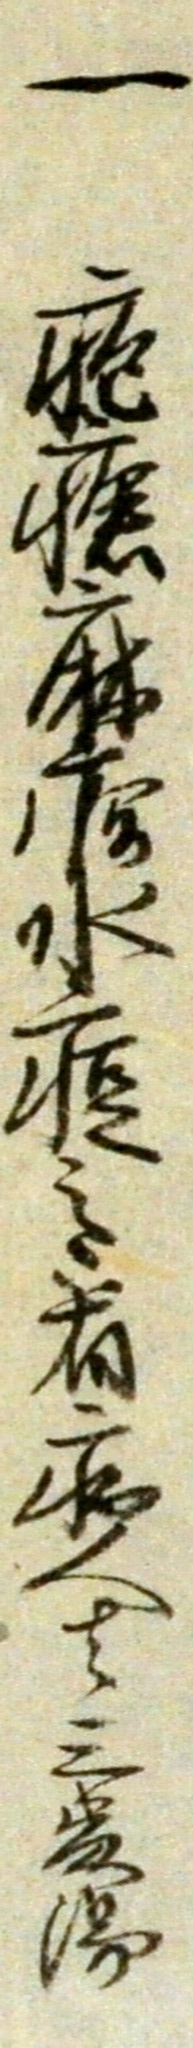一疱瘡麻疹水痘之看病人は三番湯
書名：若君様（家斉嫡男）誕生諸祝儀ノ節ノ留書外
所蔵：伊那市立高遠町図書館・合同会社AMANE
